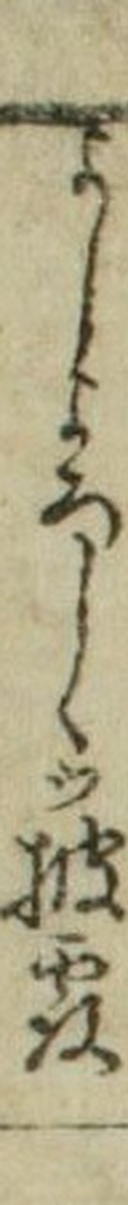よしよろしく御披露
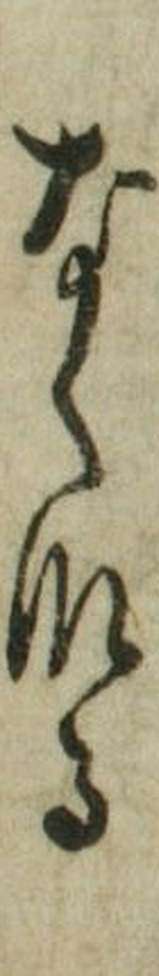なくなる

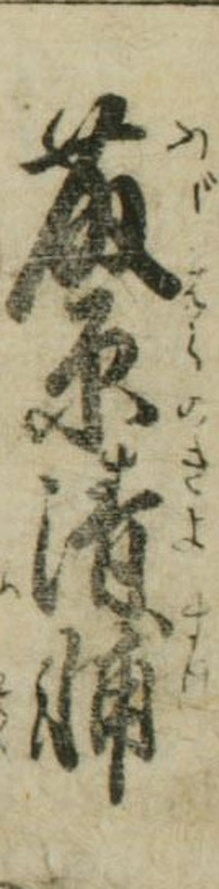藤原清輔
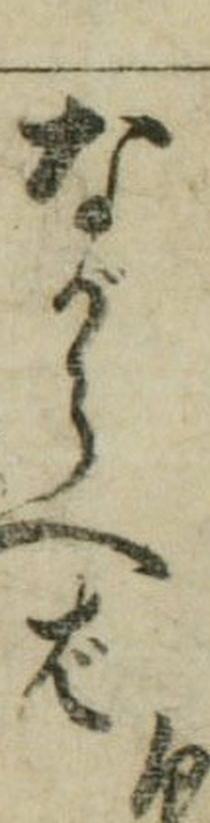ながらへば
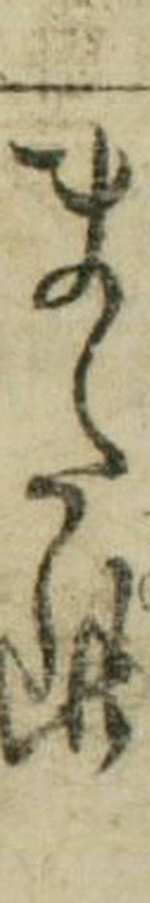また此
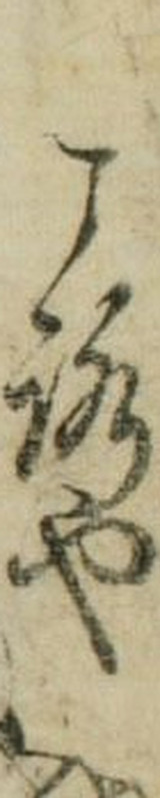ころや
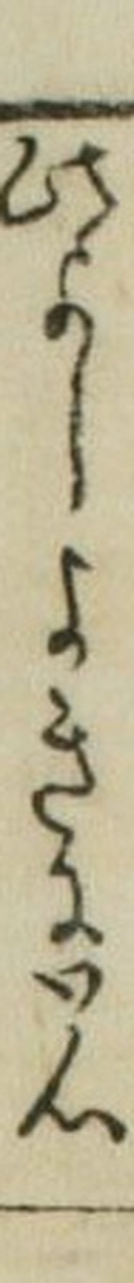此よしよきに御心
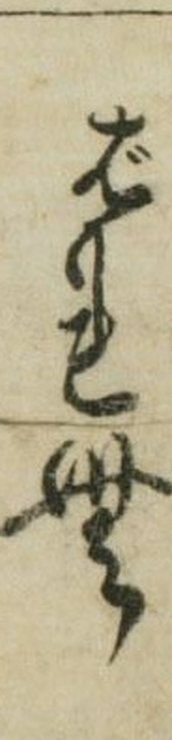ばれむ
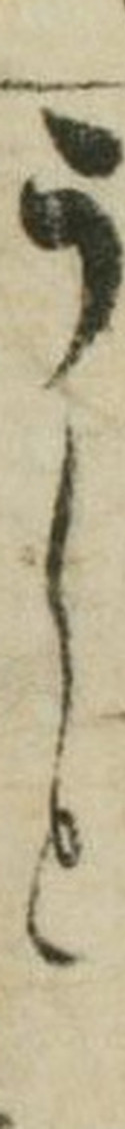うしと
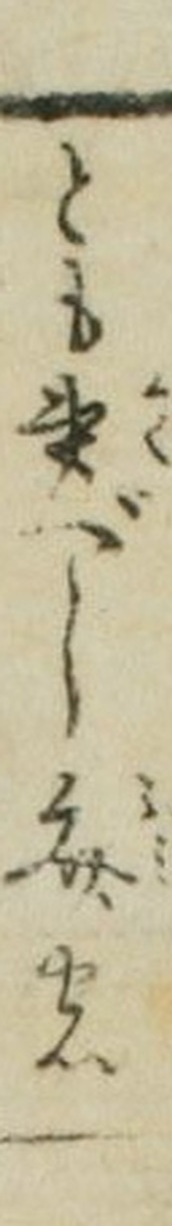とも書べし文の
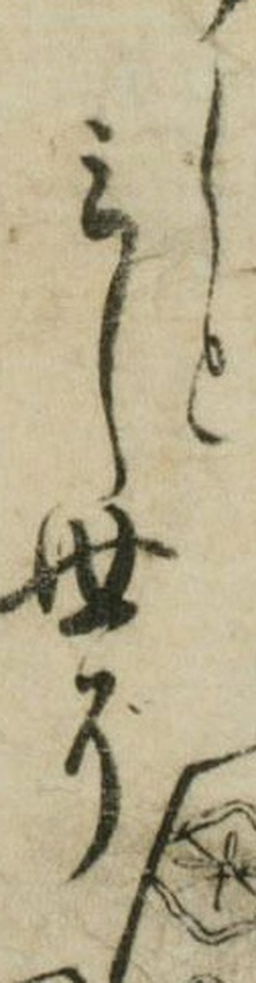みし世ぞ
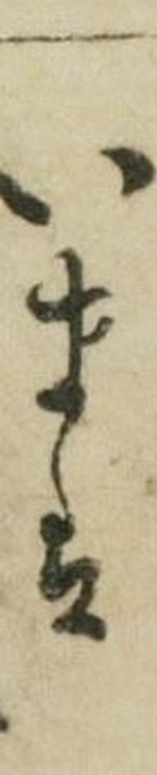いまは
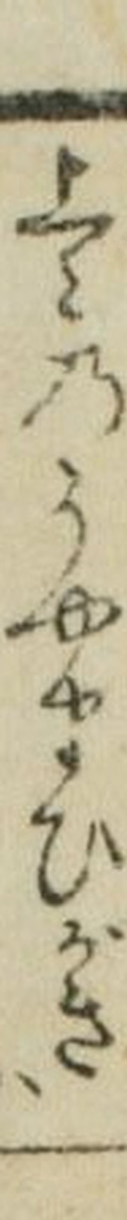上々のうやまひがきは
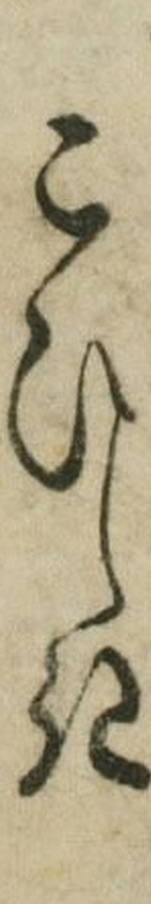こひしき
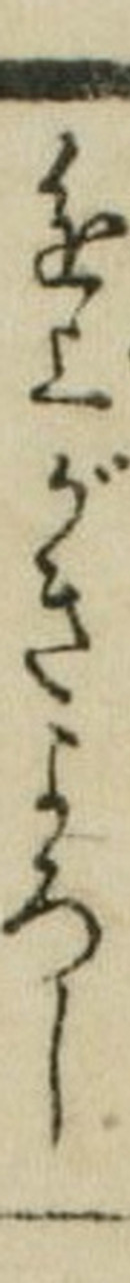進上がきよろし
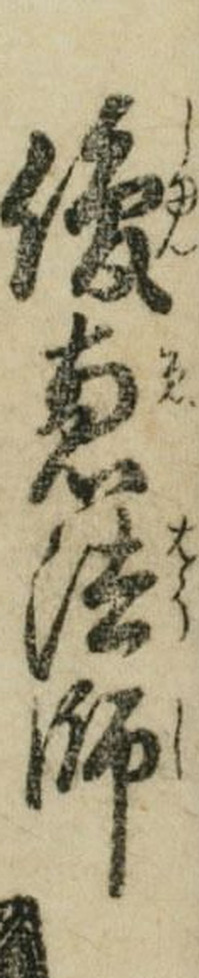俊恵法師
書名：百人一首
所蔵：東京学芸大学教育コンテンツアーカイブ
